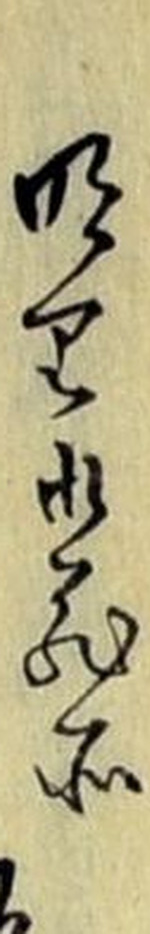明里御蔵所
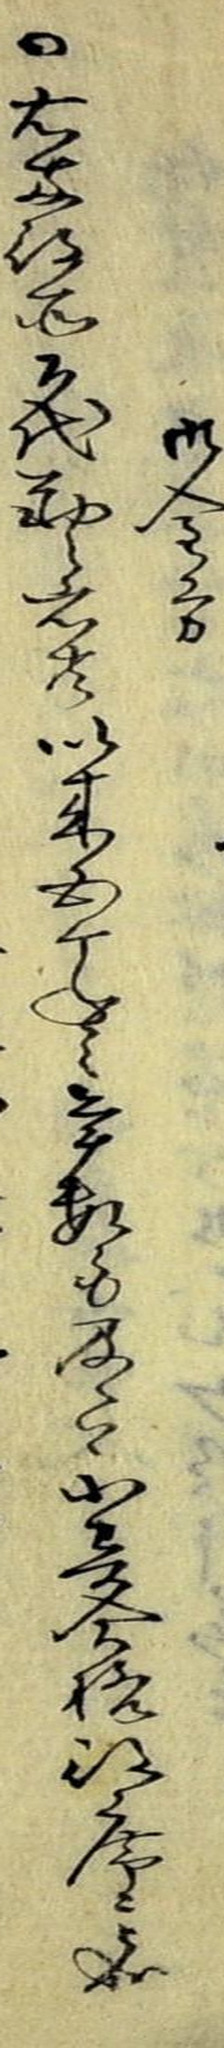〇右両役所下代勤之者共以来五ケ年之年数ニも及候ハヽ小寄合格役席ニ被成
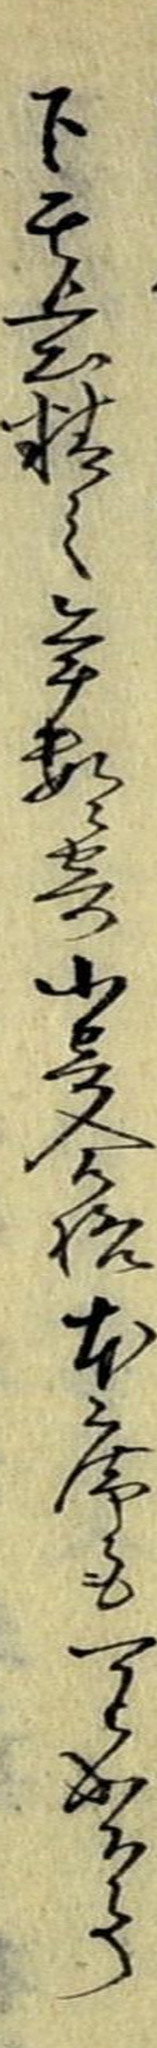下其上出精之年数ニ寄小寄合格本席ニも可被成下事
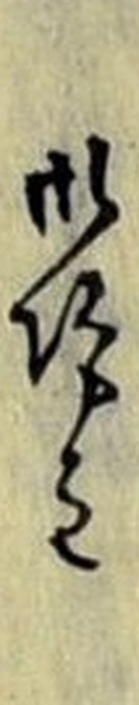御坊主
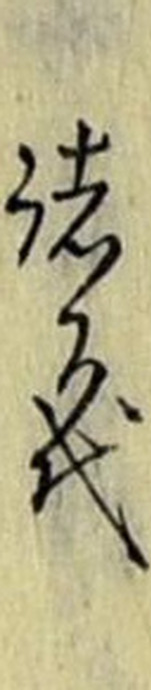諸下代
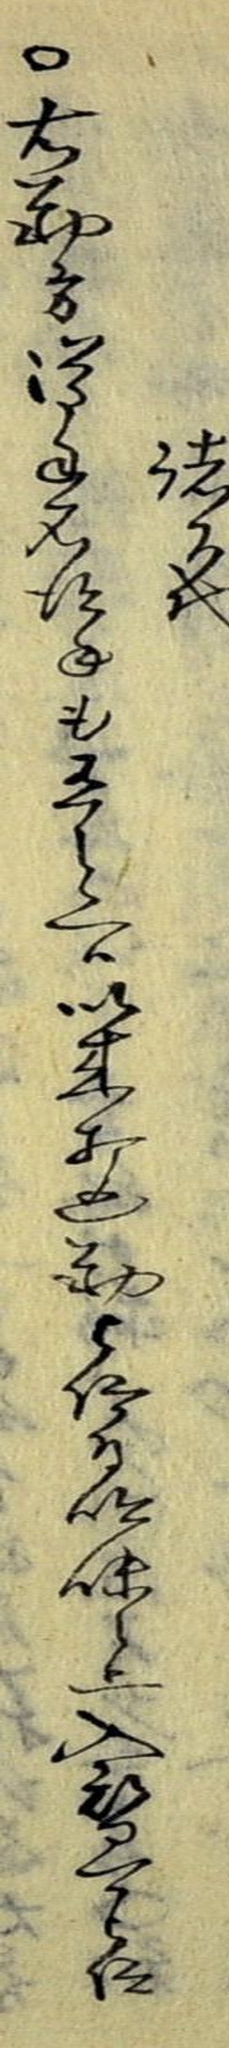〇右勤方得手不得手も有之候へハ以来打込被仰付吟味之上入替可被仰
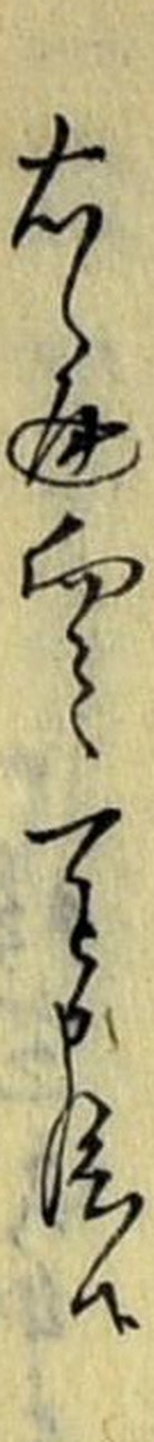右之通向々へ可被申渡候
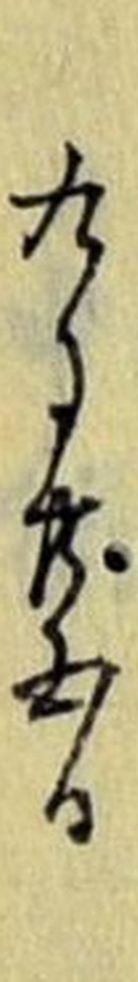九月廿五日

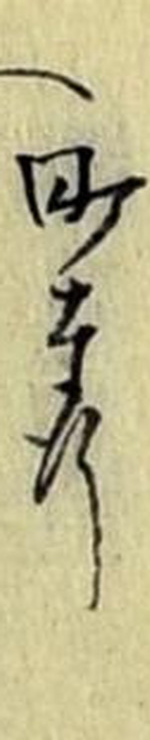町奉行
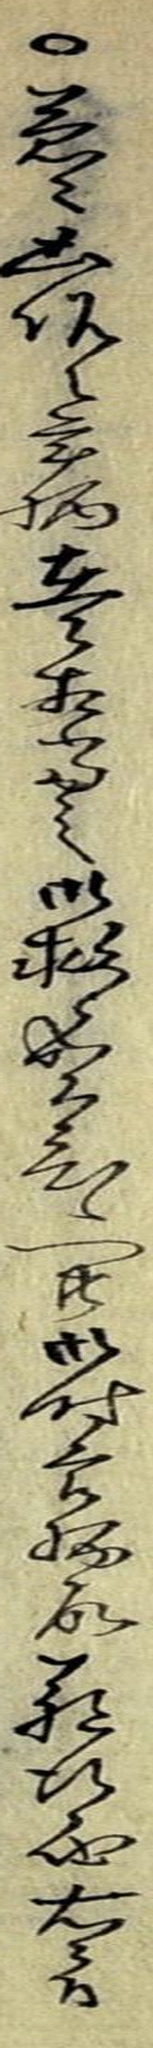〇兼々凶作之年柄在々相当之御救被成下度候へ共御時節柄故難行届右ニ付
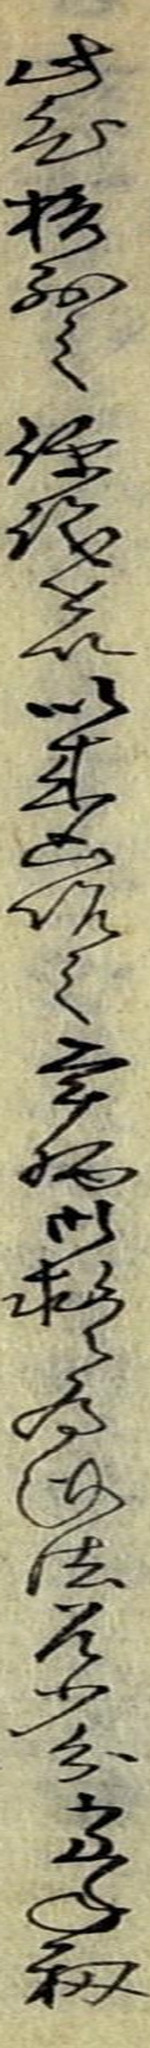此度格別之評議を以以来凶作之年柄御救之為趣法乍少分当年籾
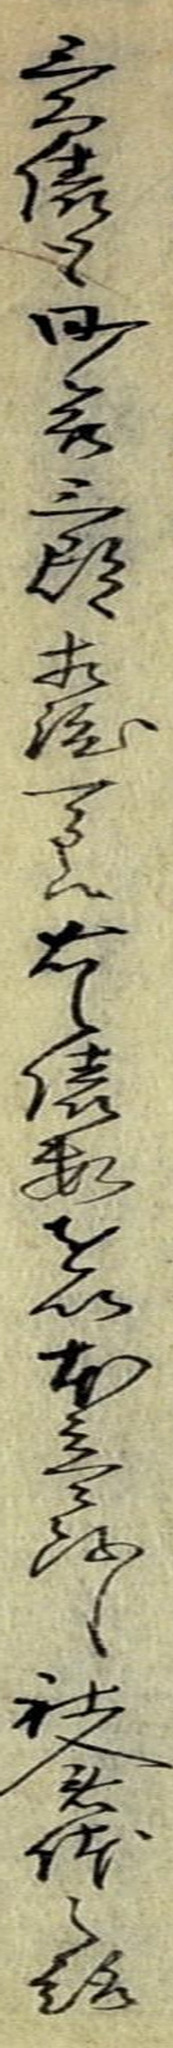三百俵ツヽ町并三郡相渡可申候右之俵数を以本立ニ致し社倉体之趣
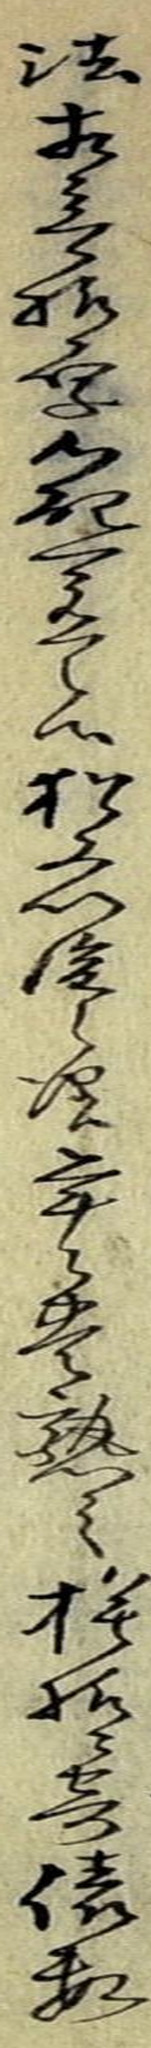法相立候様厚心配可有之候猶又以後之儀ハ年々豊熟之模様ニ寄俵数
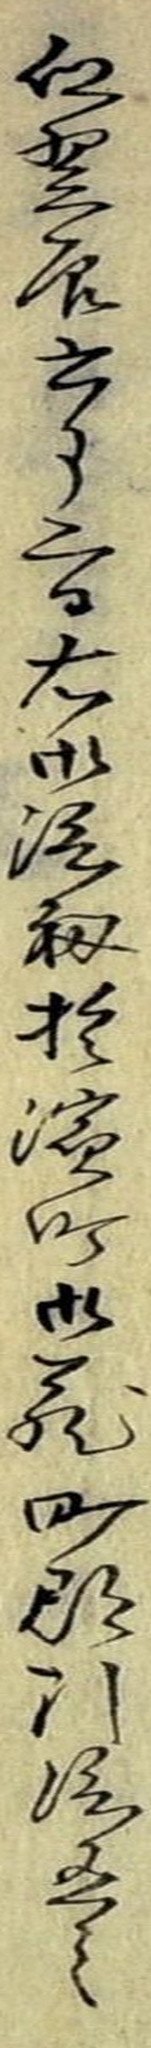但翌辰六月二日右御渡籾於浜町御蔵町郡引渡有之
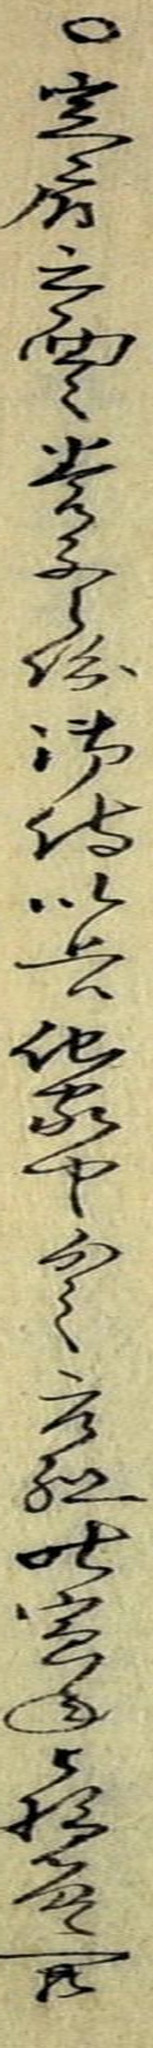〇定府之面々養子之儀御侍以上ハ他家中ゟ之取組昨寅年被指留候へ共
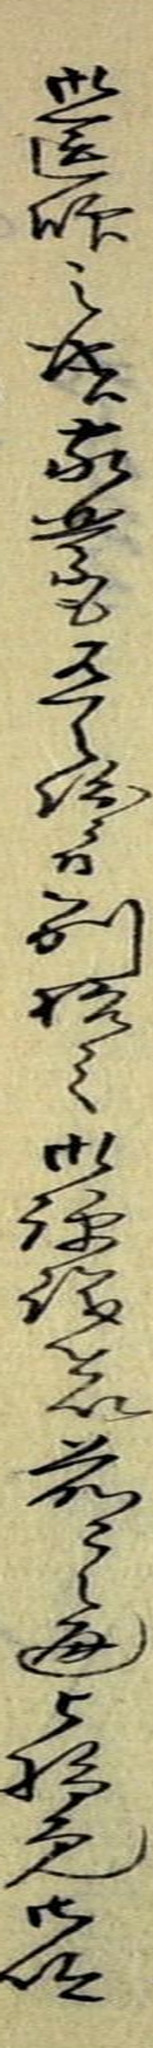御医師之儀ハ家業も有之儀ニ付別格之御評議を以前々之通被指免御吟
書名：命令之部 五
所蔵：福井県文書館 Fukui Prefectural Archives
